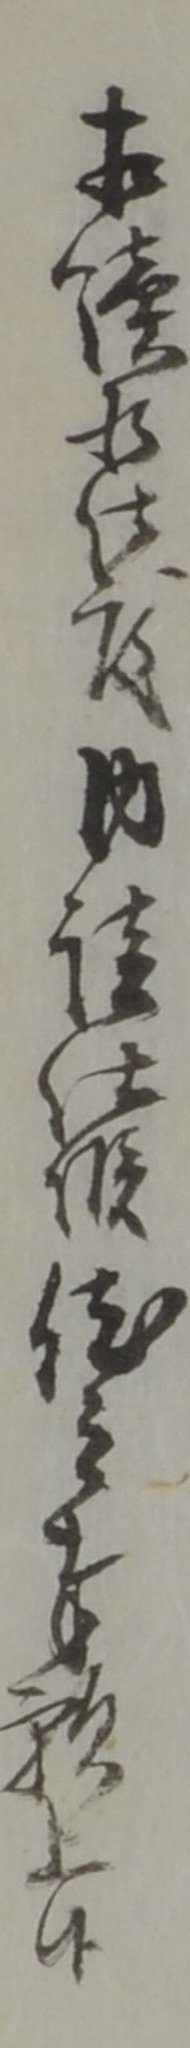相続為仕度内談仕候依之奉願上候
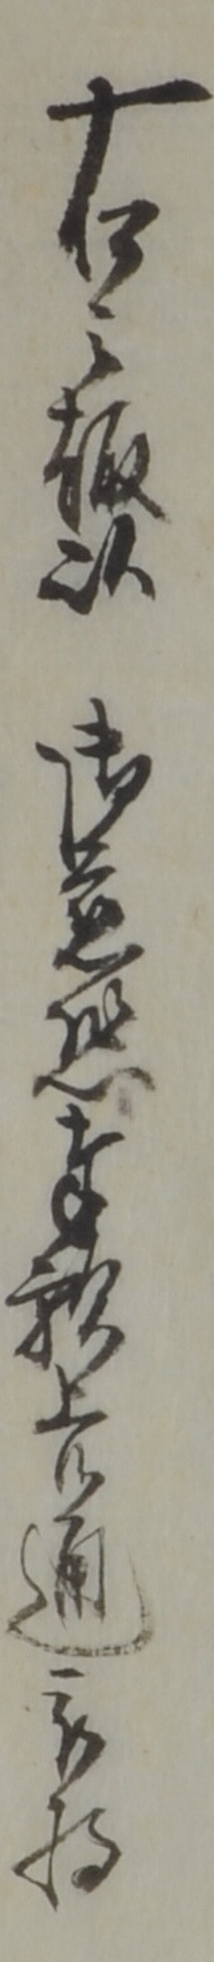右之趣以御慈悲奉願上候通被為仰付
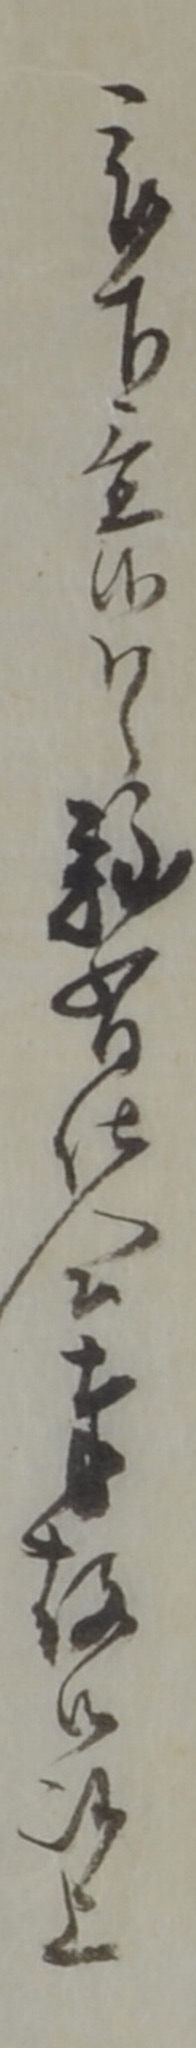被下置候ハヽ難有仕合奉存候以上
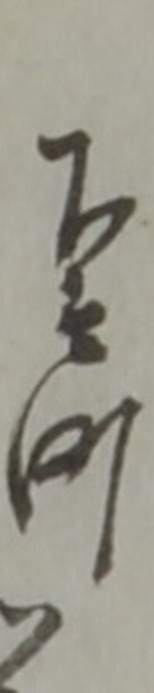下モ町
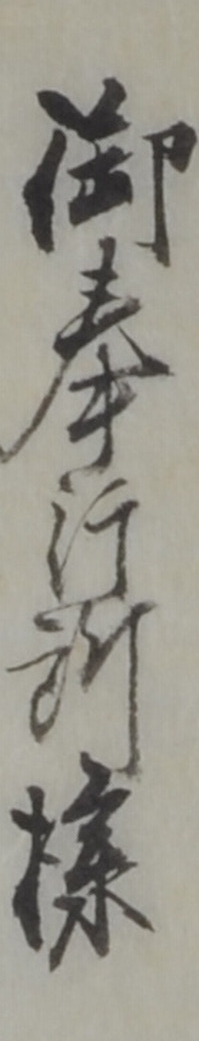御奉行所様
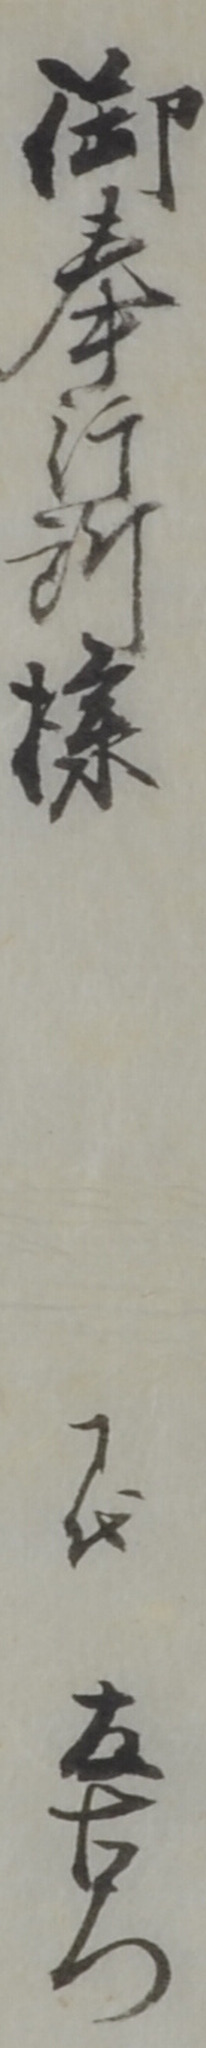御奉行所様丁代友右衛門
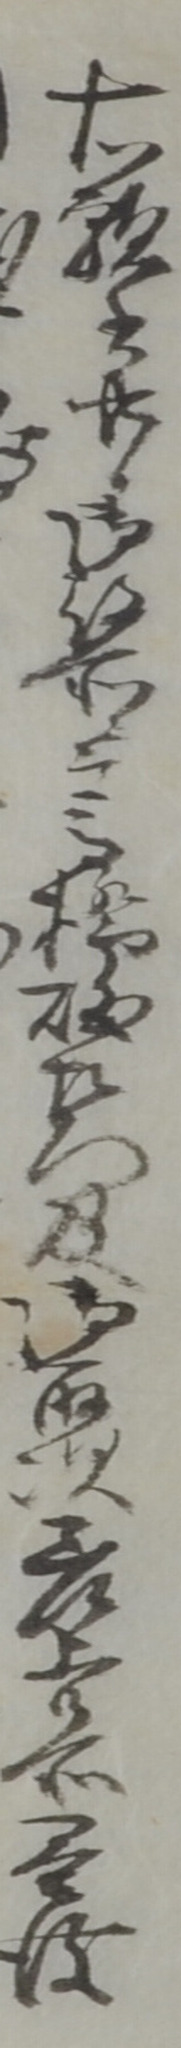右願書廿日御役所二而高橋磯左衛門氏御取次差上候所奉存
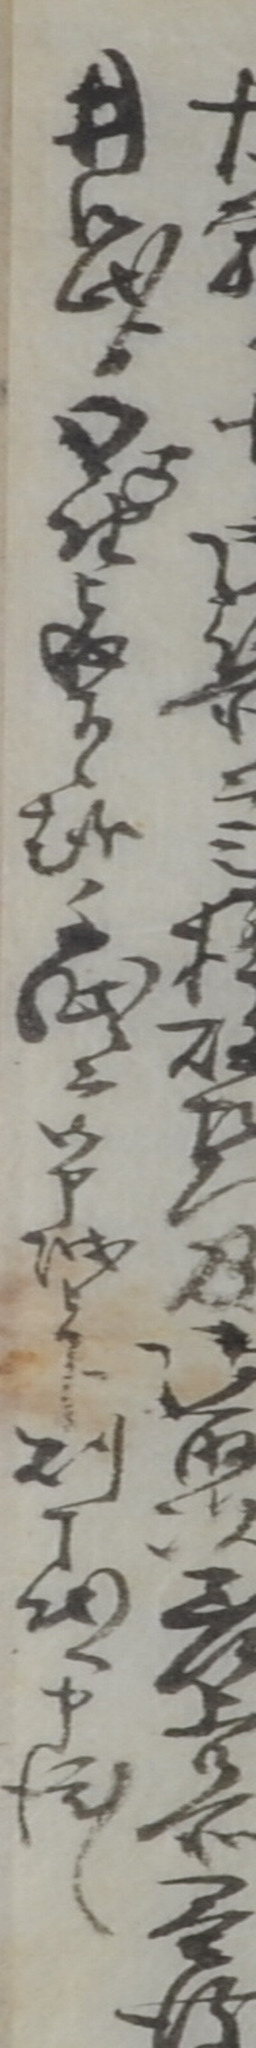井口氏ゟ御聞届被成下候趣手紙ニ而御申越被申下候則丁代申渡候

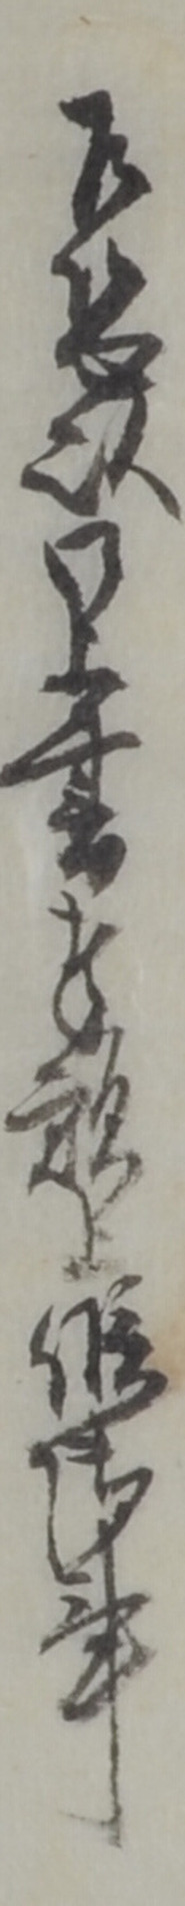乍恐以口上書奉願上候御事
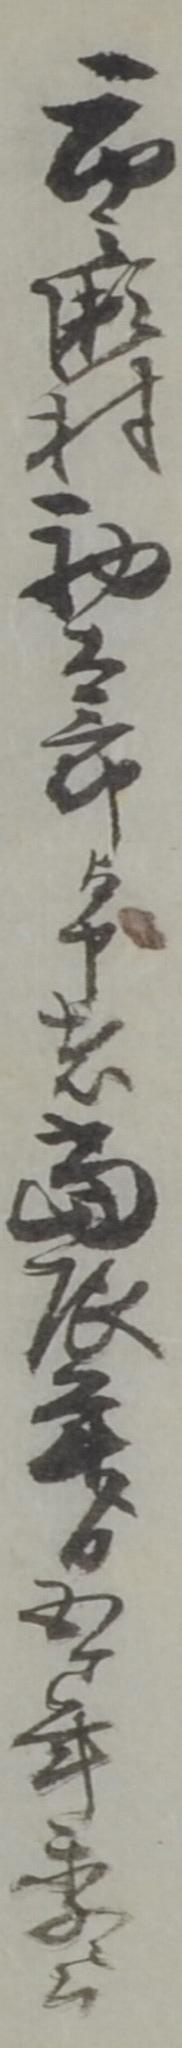市之瀬村初太郎与申者当辰年ゟ五ヶ年季ニ而
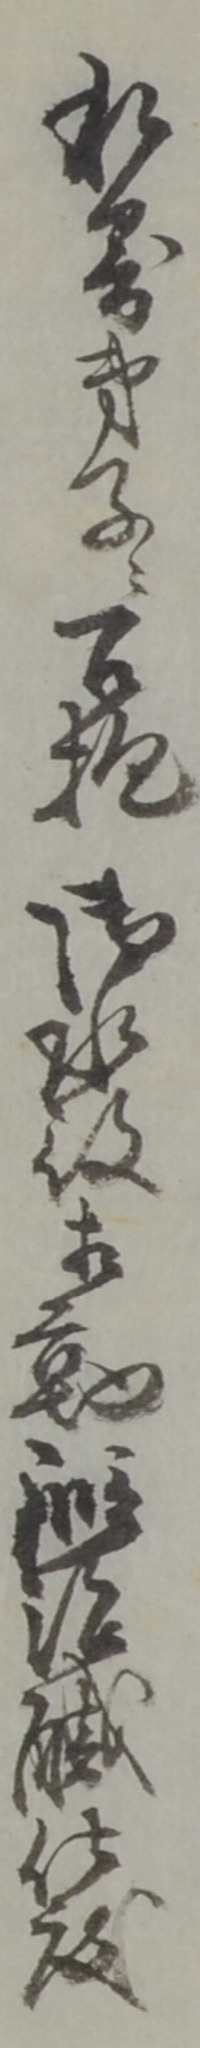私寄弟子ニ召抱御水役相勤鍛冶職仕度
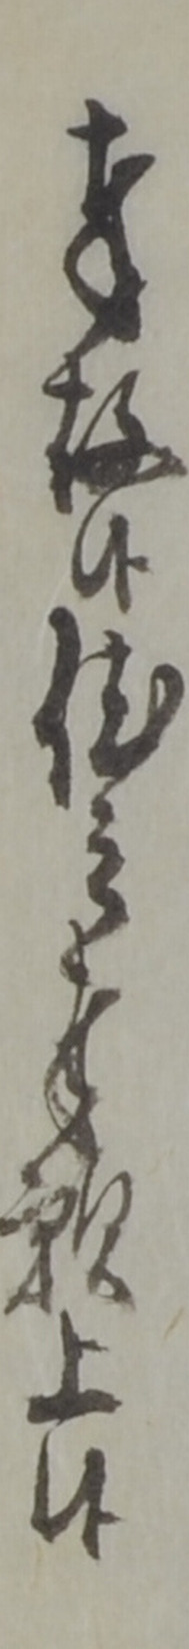奉存候依之奉願上候
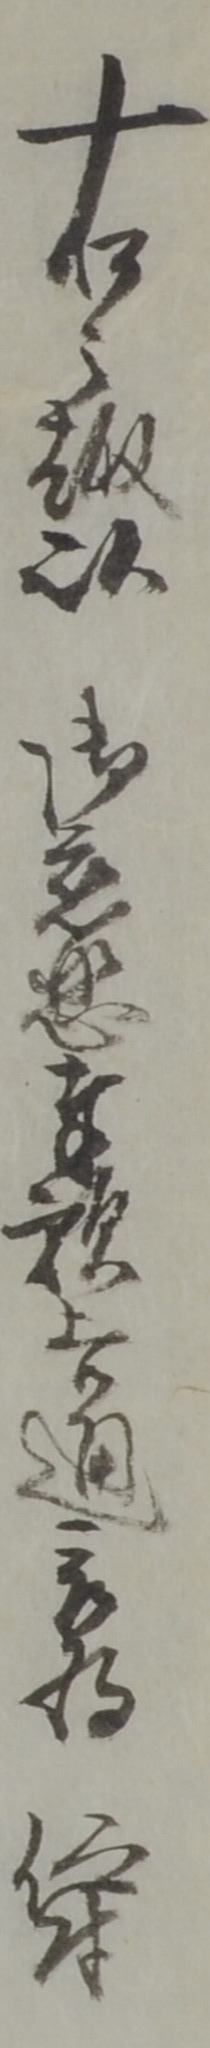右之趣以御慈悲奉願上候通被為仰付
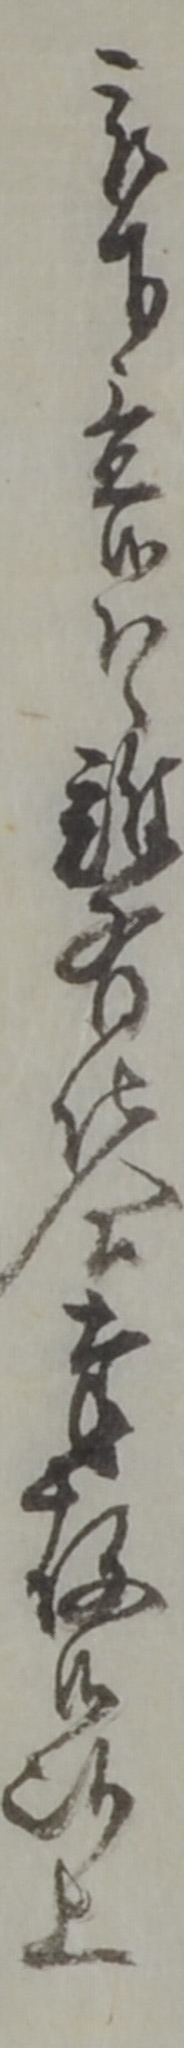被下置候ハヽ難有仕合奉存候以上
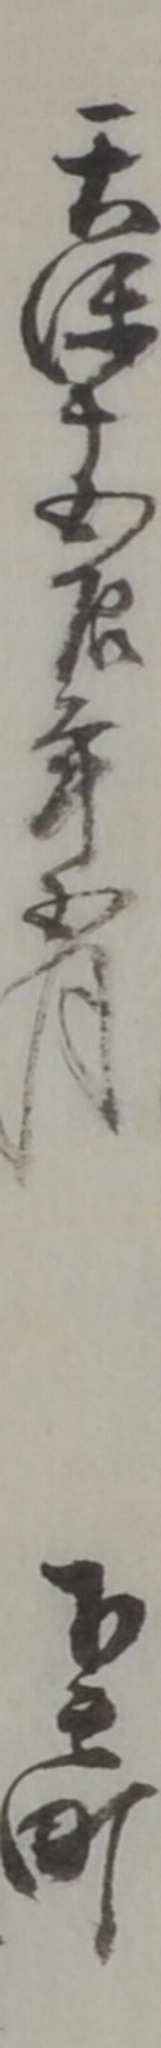天保十五甲辰年五月下モ町
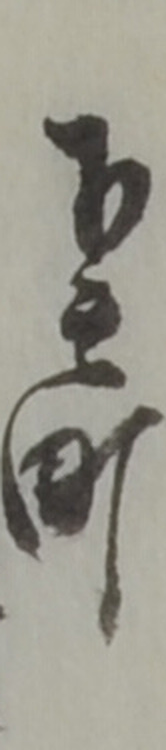下モ町
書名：諸願書控簿
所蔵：伊那市立高遠町図書館・合同会社AMANE
